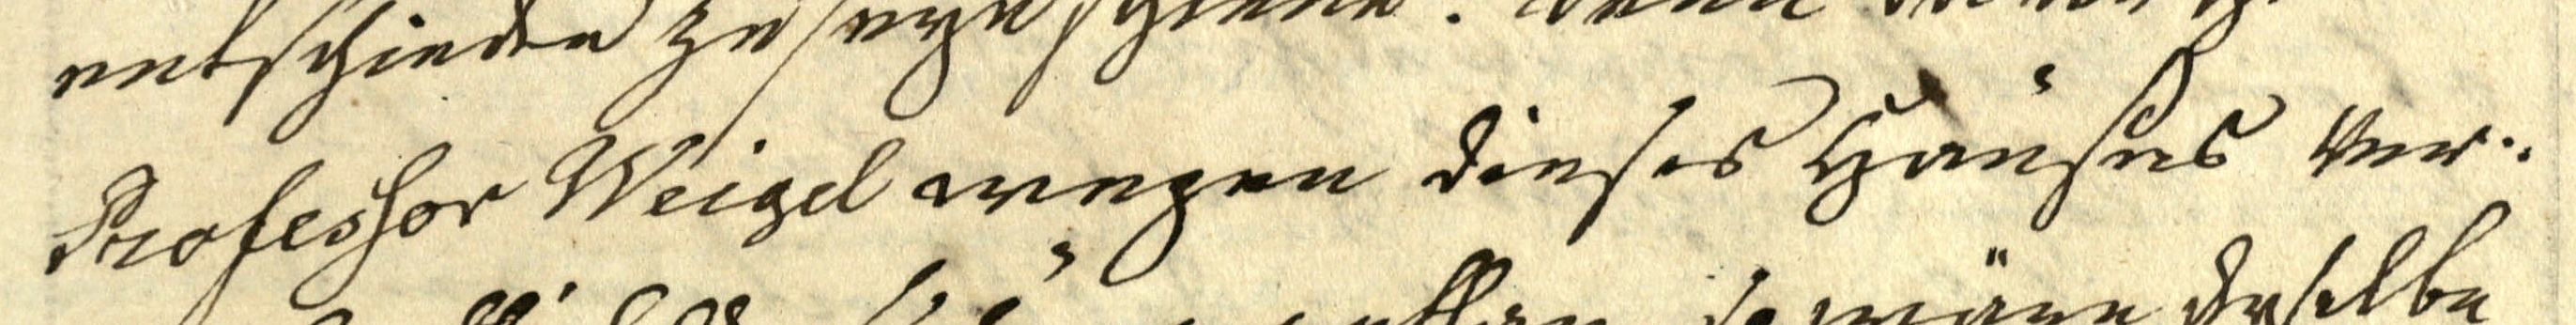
Professor Weigel wegen dieses Haußes ver¬
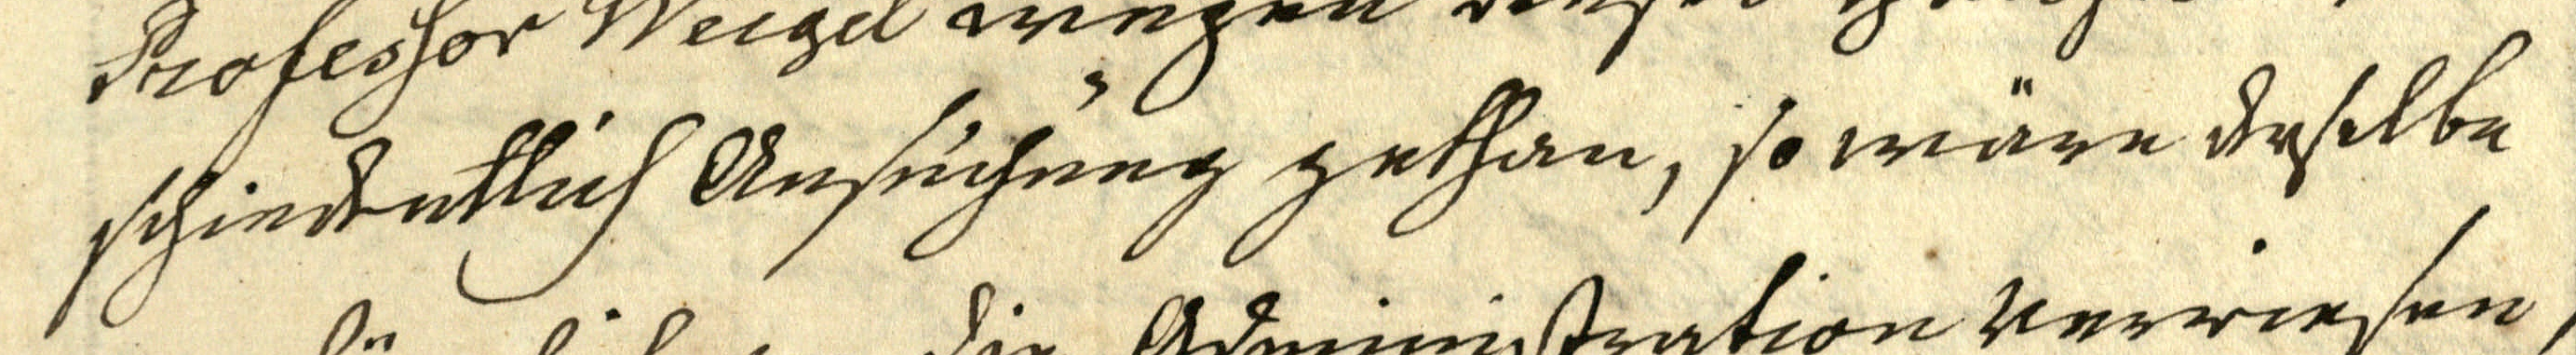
schiedentlich Ansuchung gethan, so wäre derselbe
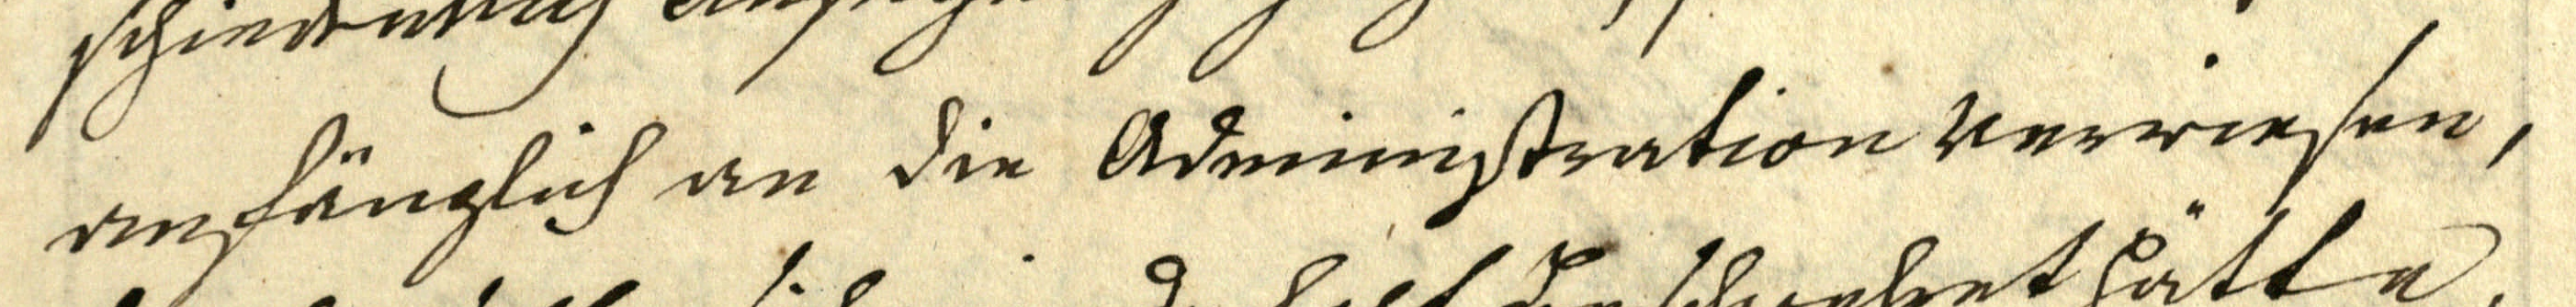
anfänglich an die Administration verwiesen,
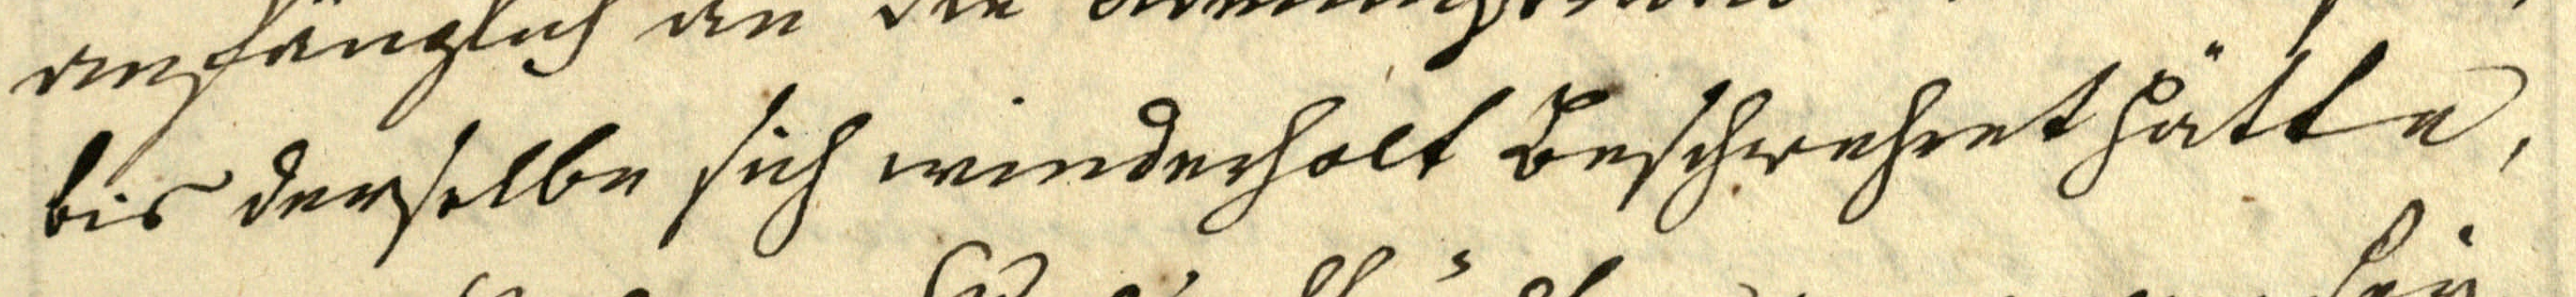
bis derselbe sich wiederholt beschwehret hätte,
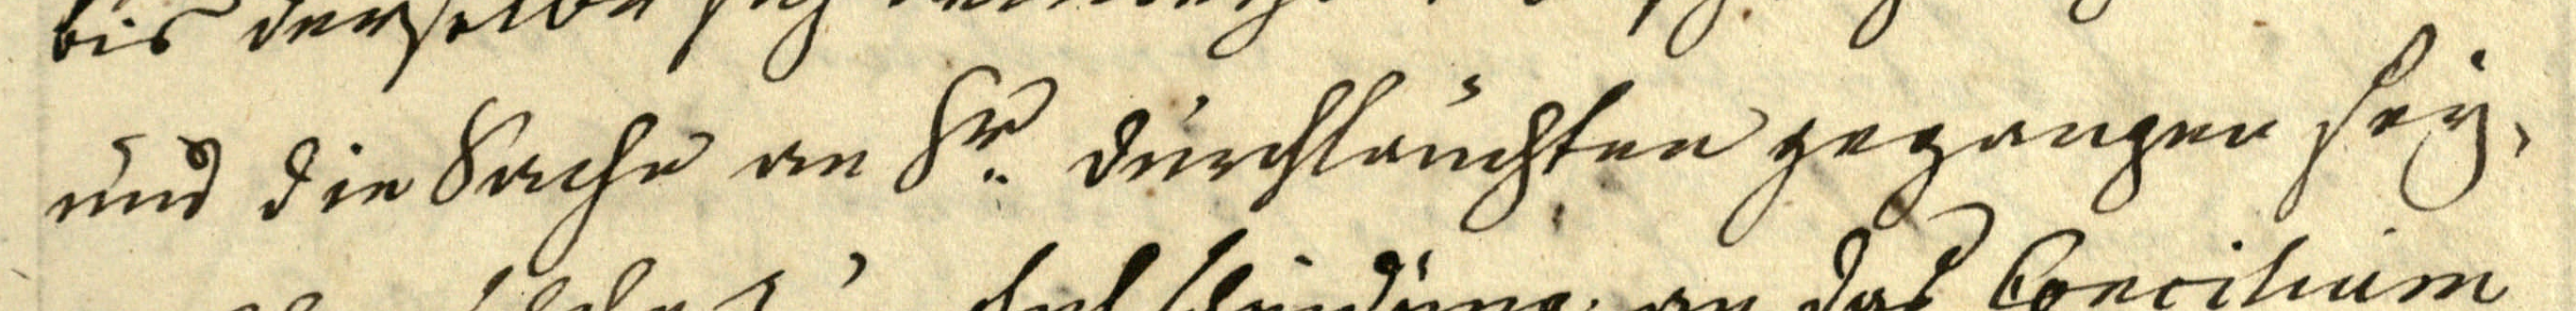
und die Sache an Sr Durchlauchten gegangen seÿ,
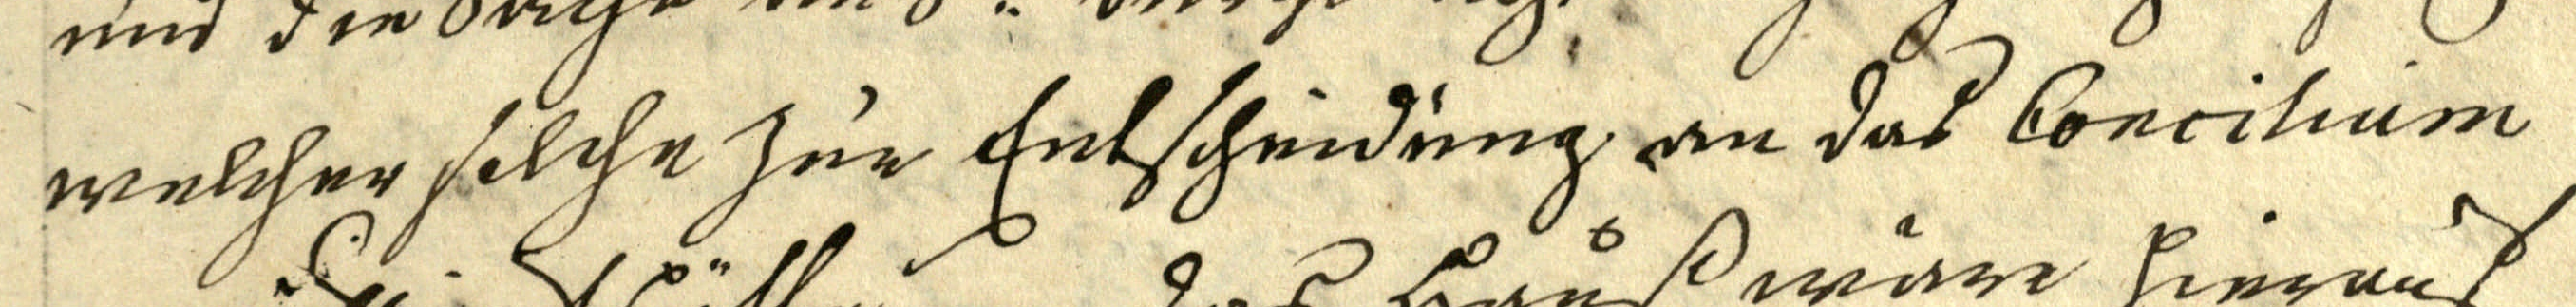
welcher solche zur Entscheidung an das Concilium
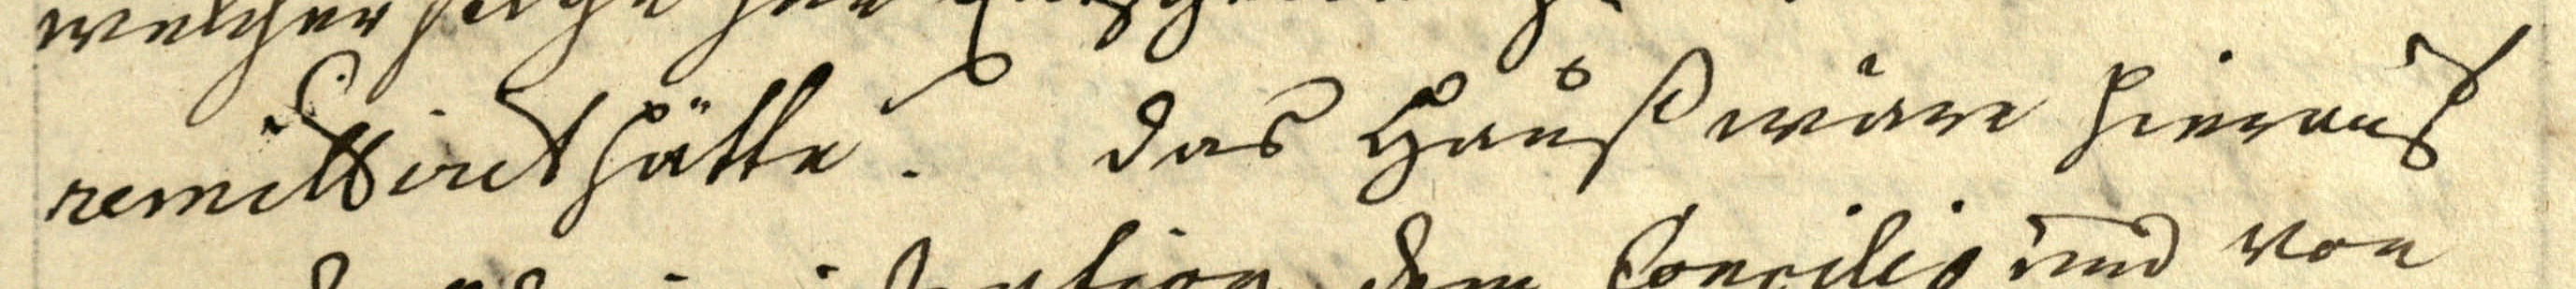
remittiret hätte. das Hauß wäre hierauf
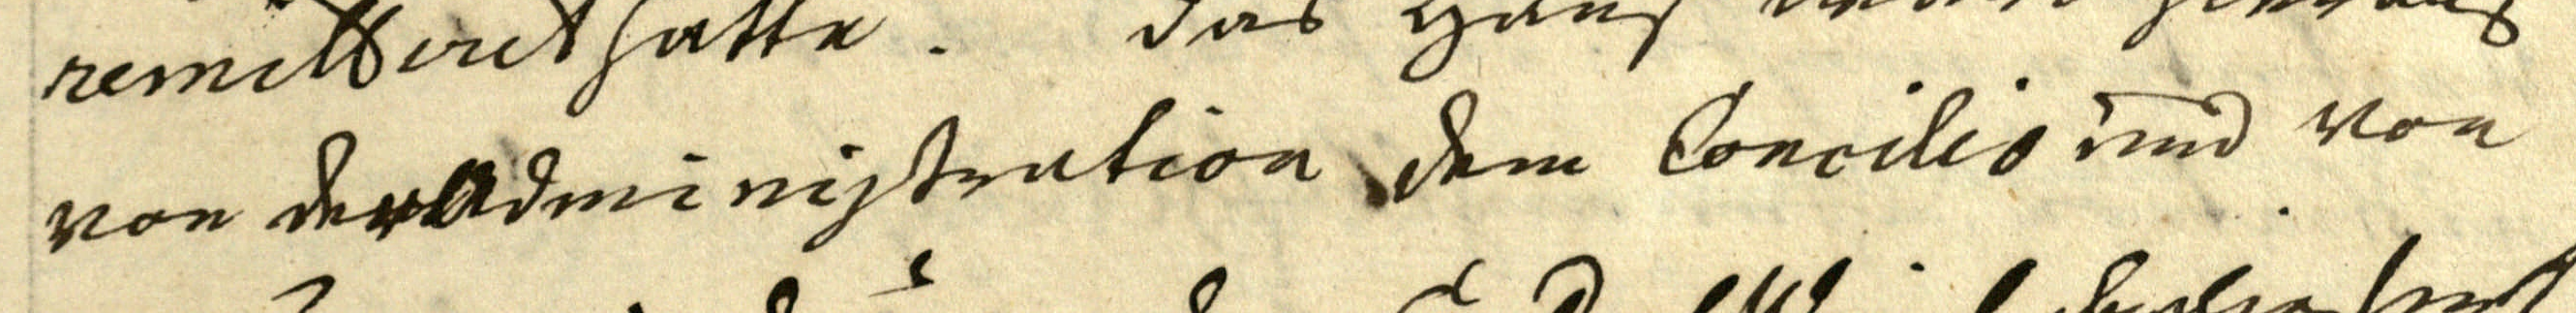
von der Administration dem Concilio und von
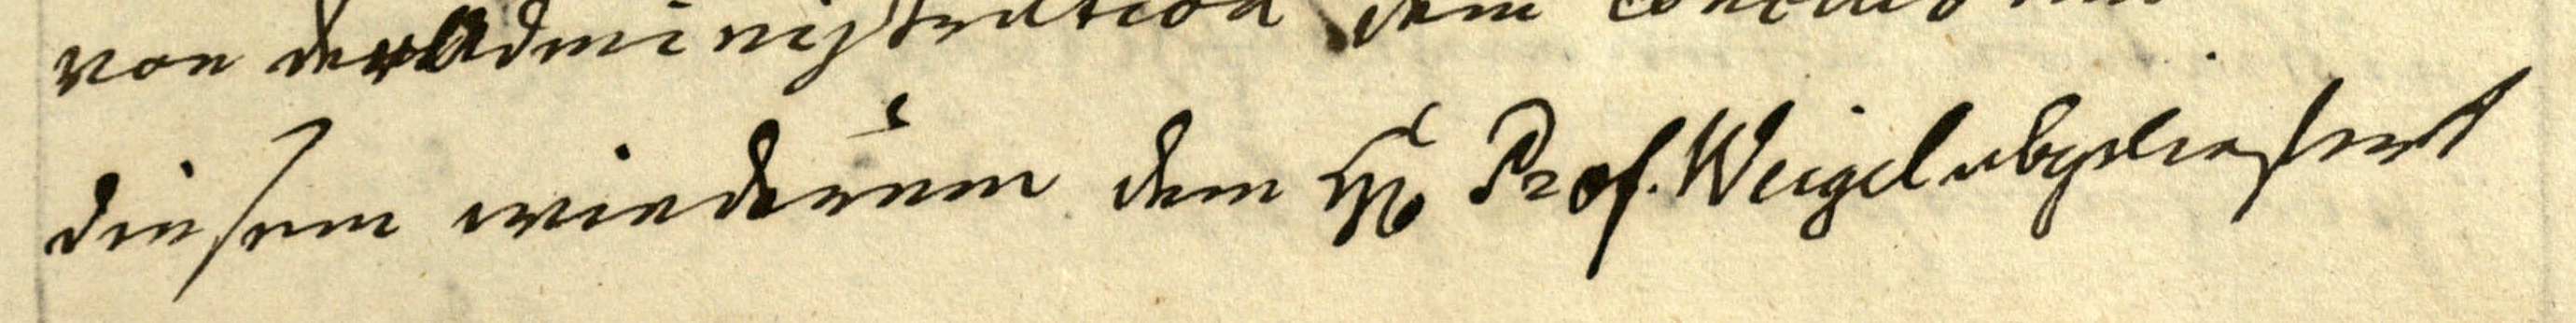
diesem wiederum dem H. Prof. Weigel abgeliefert
